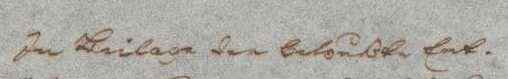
In Beilage der bewußte Ent-
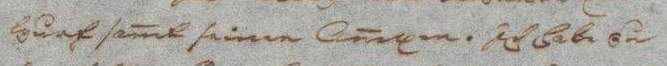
wurf sammt seinen Annexen. Ich habe zu
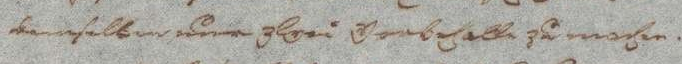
demselben nur zwei Vorbehalte zu machen.
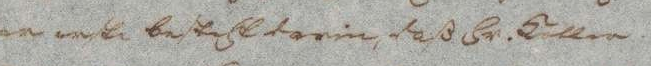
Der erste besteht darin, daß Hr. Koller
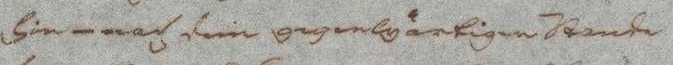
hin – nach dem gegenwärtigen Stande
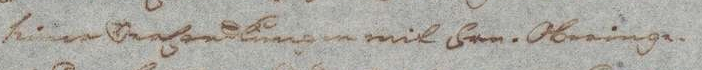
seiner Verhandlungen mit Hrn. Oberinge-
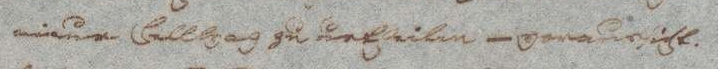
nieur Hellwag zu urtheilen – voraussicht-
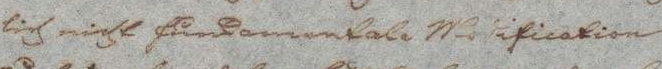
lich nicht fundamentale Modification
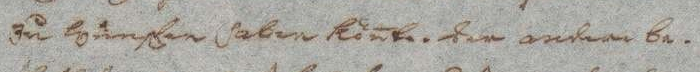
zu wünschen haben könnte. Der andere be-
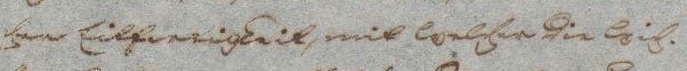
chen Eilfertigkeit, mit welcher die wich-
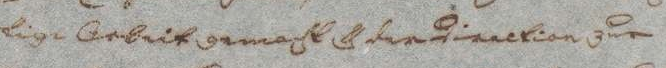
tige Arbeit gemacht & der Direction zur
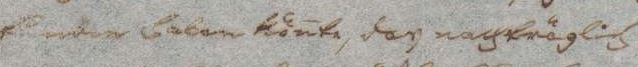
gefunden haben könnte, das nachträglich
